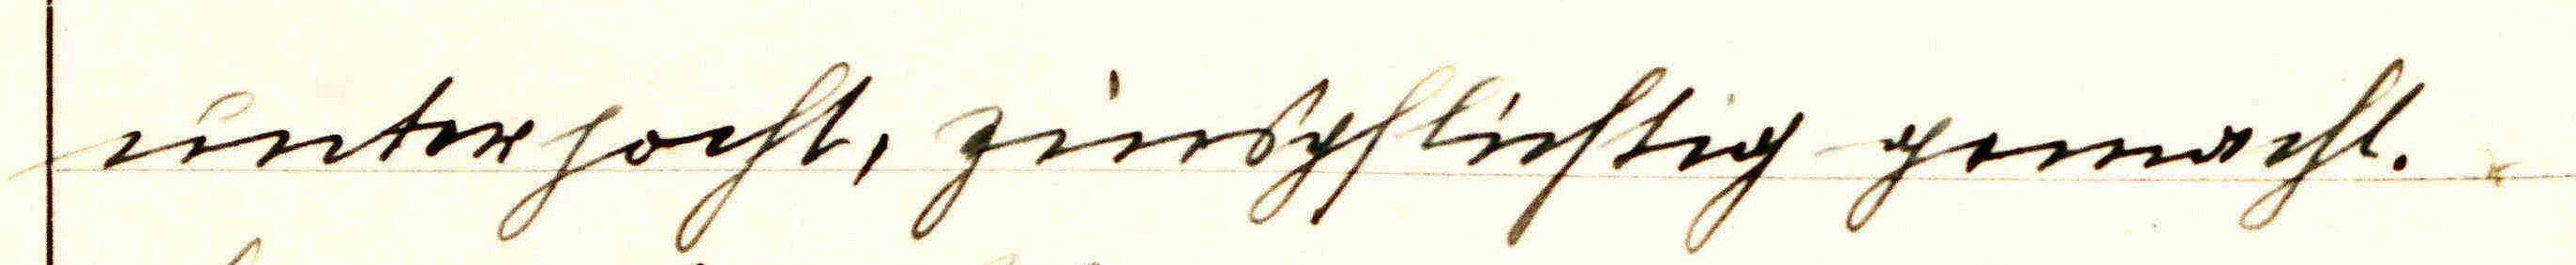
unterjocht, zinspflichtig gemacht.
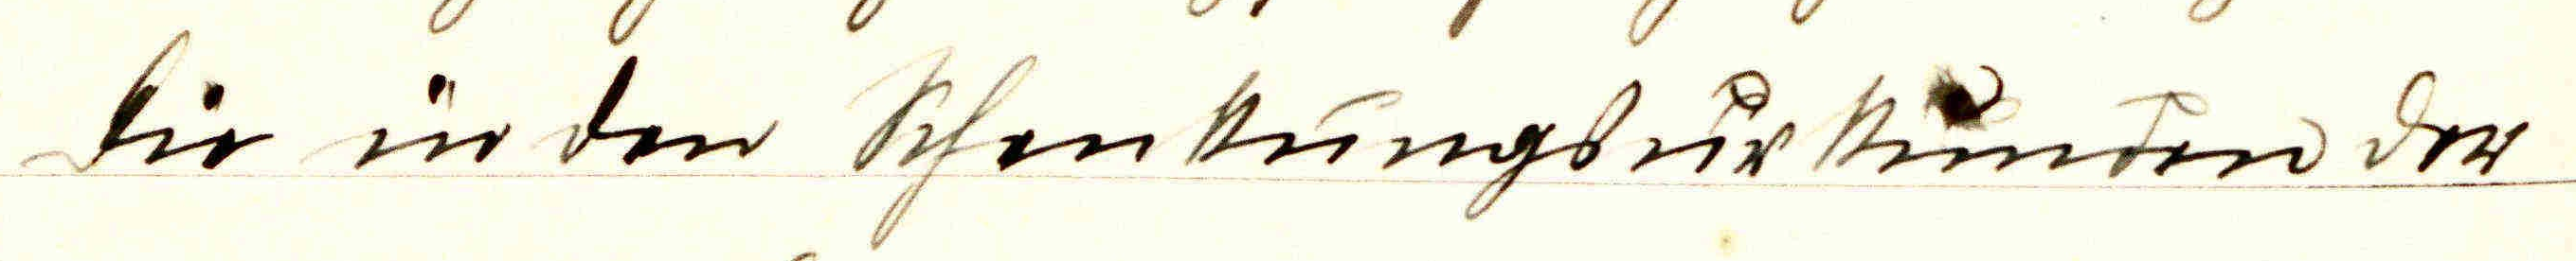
Die in den Schenkungsurkunden der
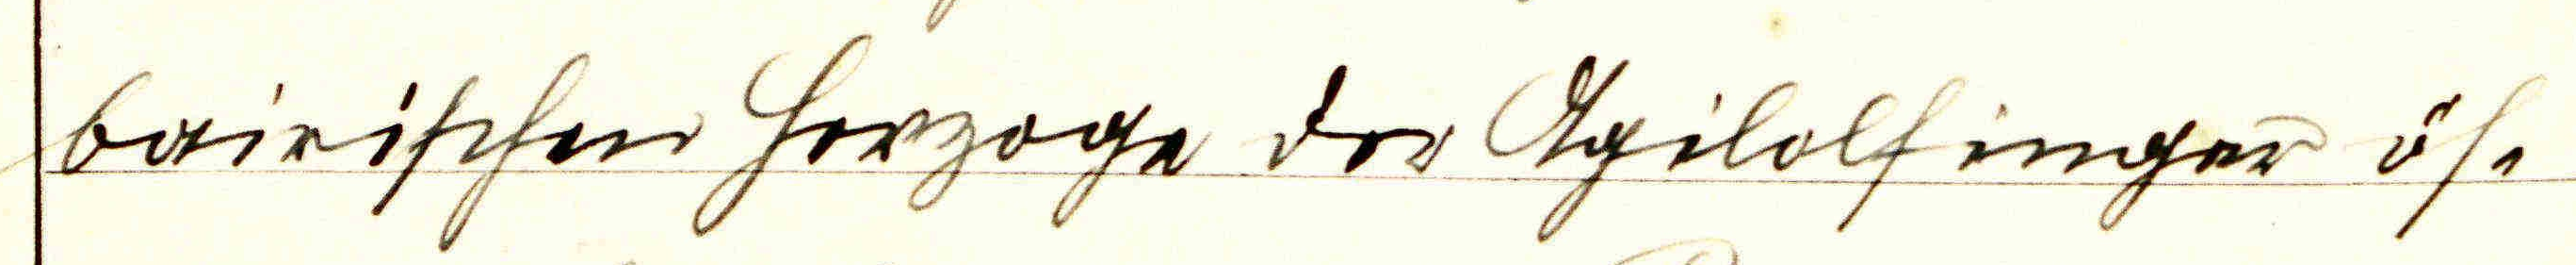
bairischen Herzoge der Agilolfinger öf-
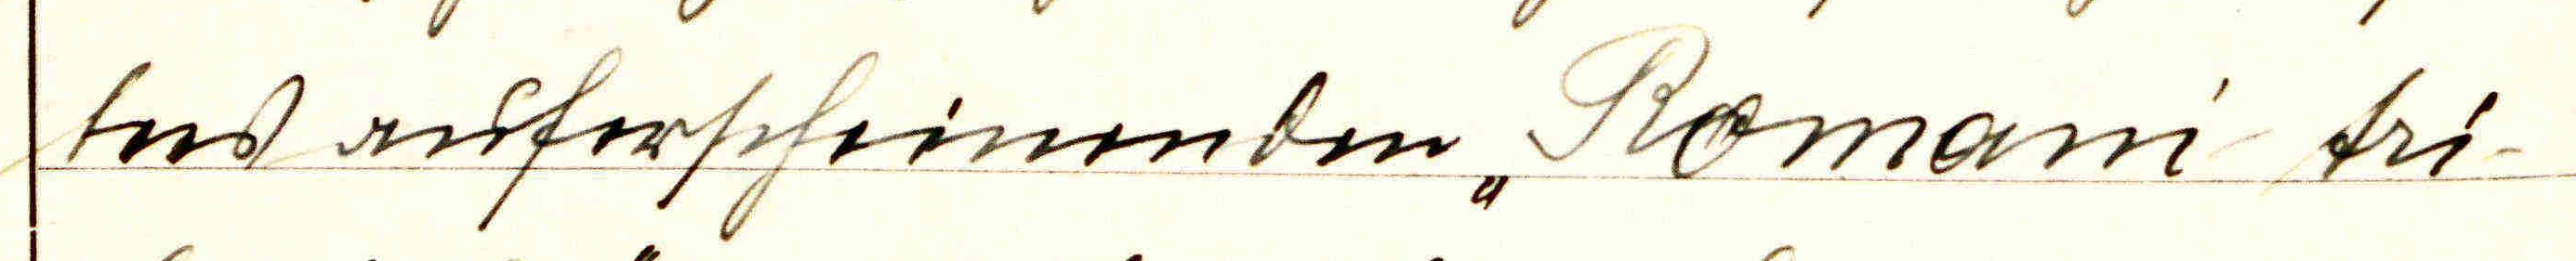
ters auferscheinenden „Romani tri-
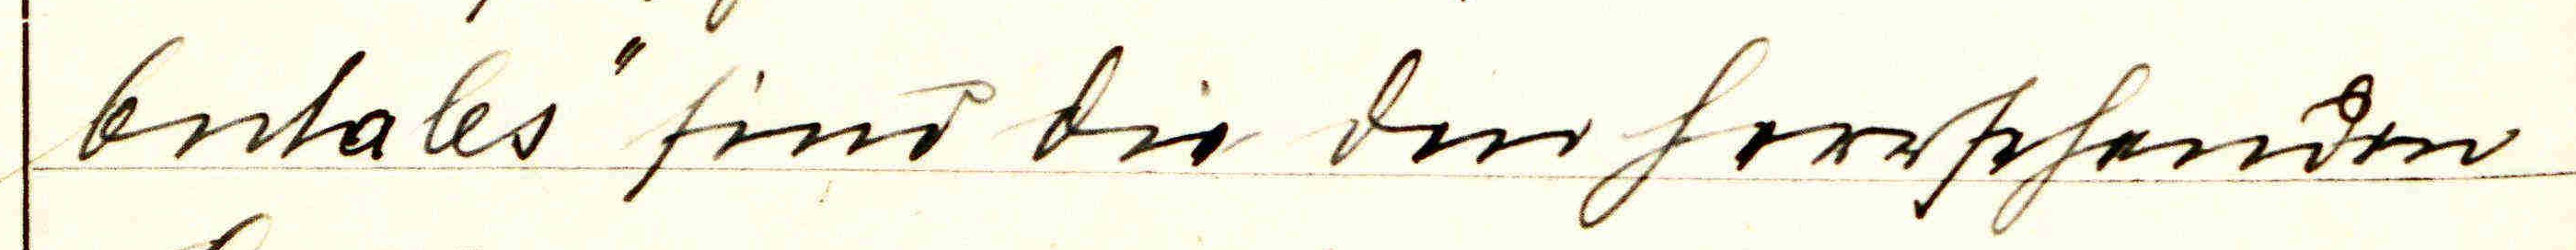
butales“ sind die den herrschenden
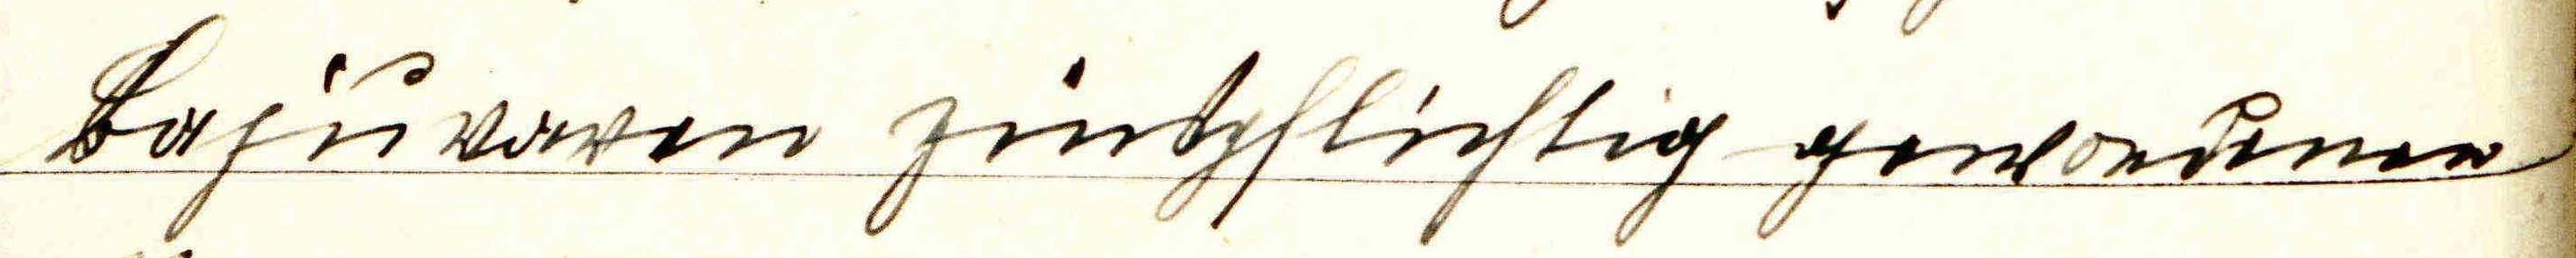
bayjuwaren zinspflichtig gewordenen
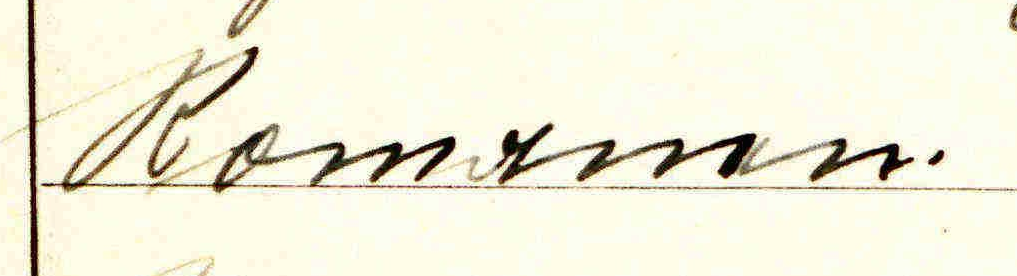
Romanen.
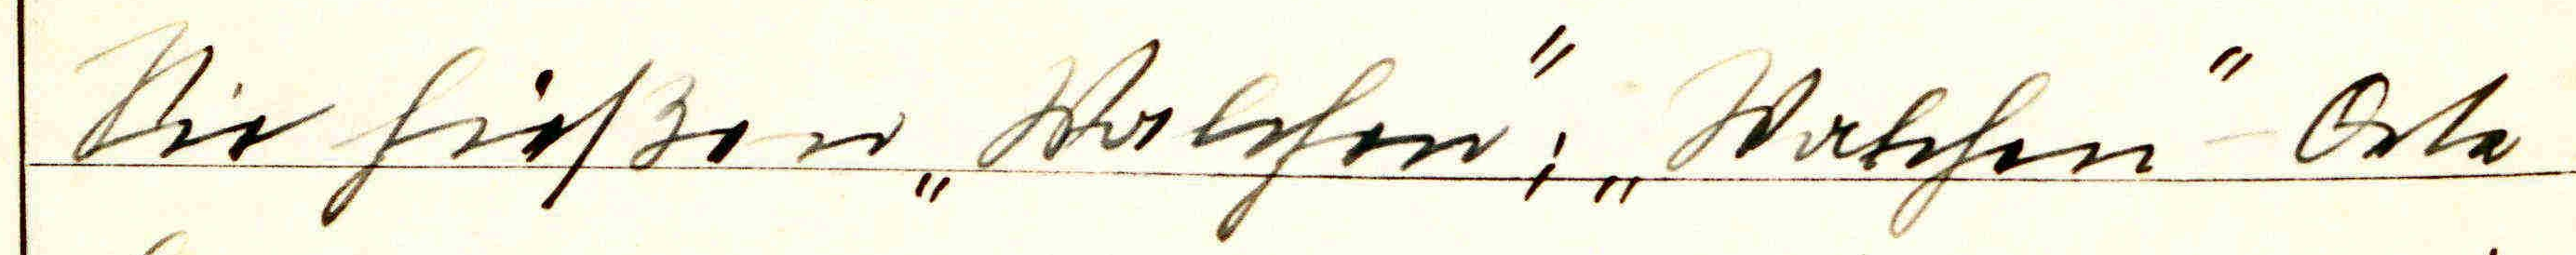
Sie hießen „Walchen“; „Watchen“ Orte
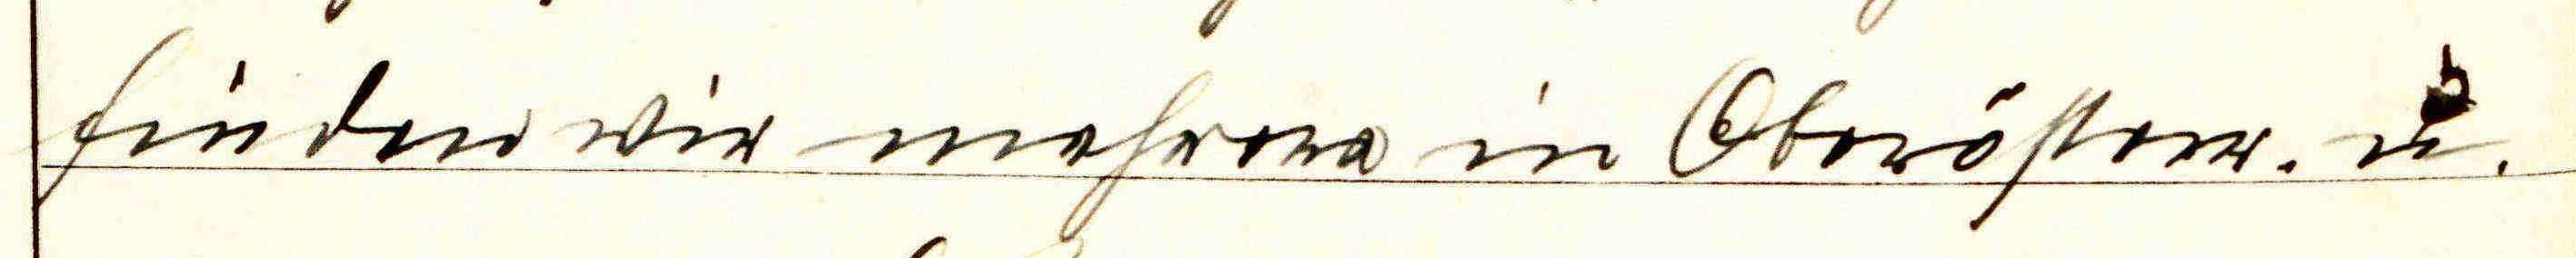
finden wir mehrere ín Oberösterr. u.
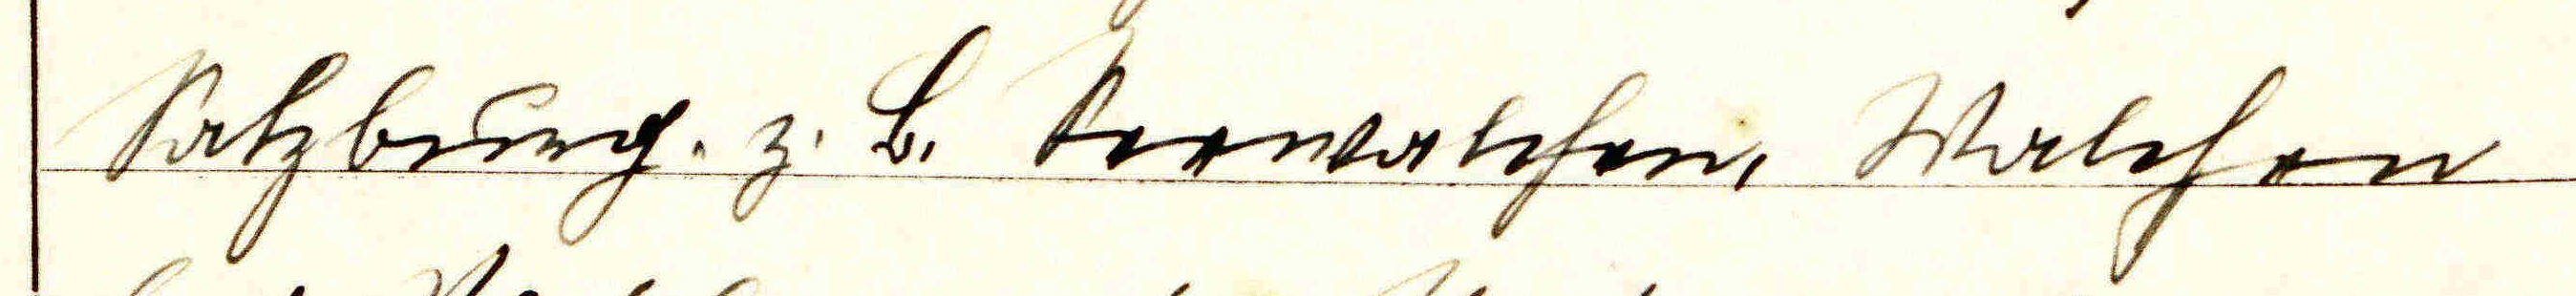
Salzburg z.B. Seewalchen, Walchen
